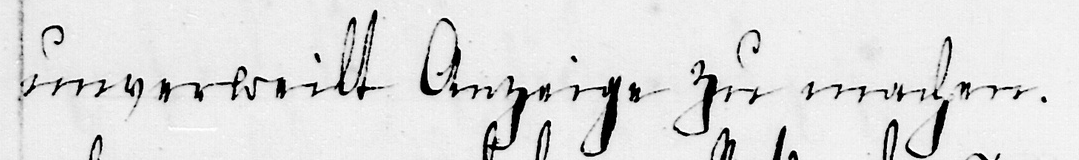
unverweilt Anzeige zu machen.
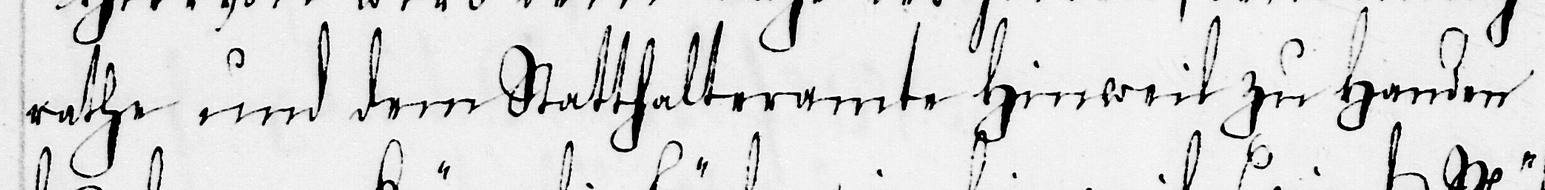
rathe und dem Statthalteramte Hinweil zu Handen
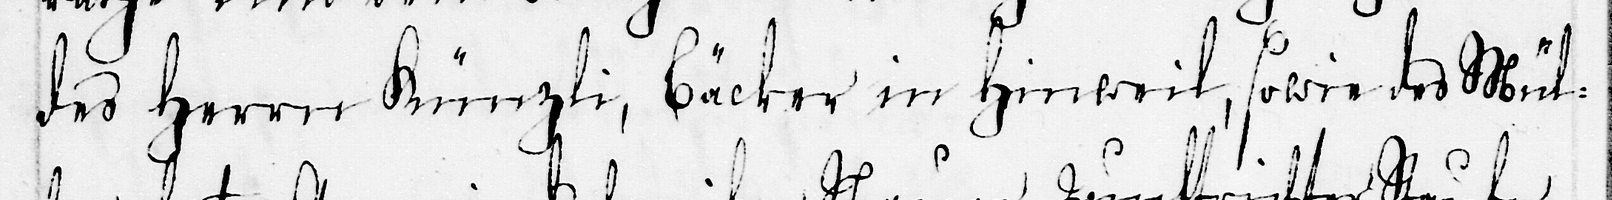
des Herrn Künzli, Bäcker in Hinweil, sowie des Mül¬
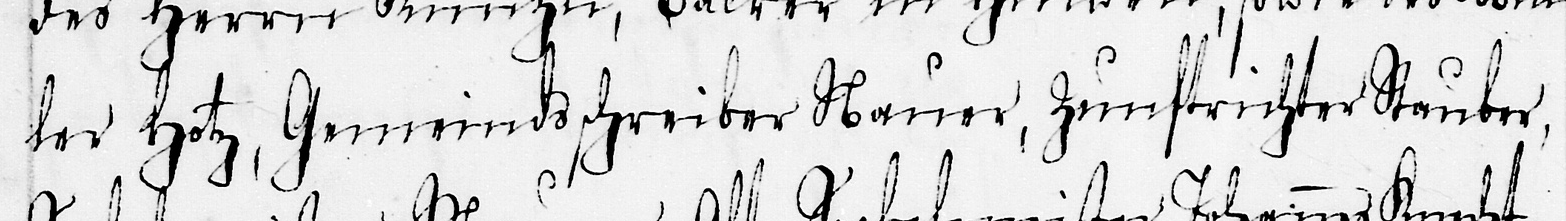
ler Hotz, Gemeindsschreiber Nauer, Zunftrichter Stauber,
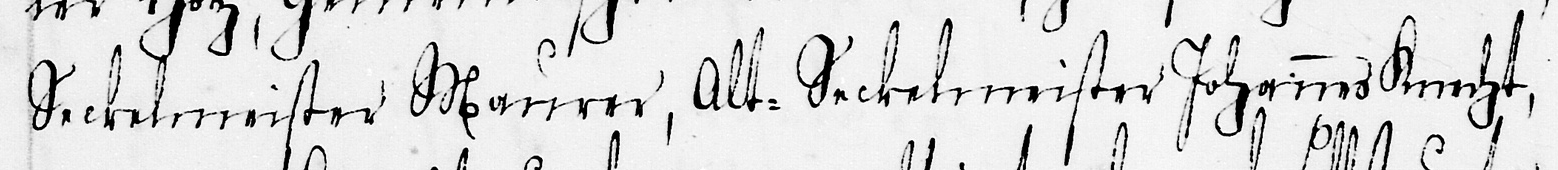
Seckelmeister Maurer, Alt-Seckelmeister Johannes Knecht,
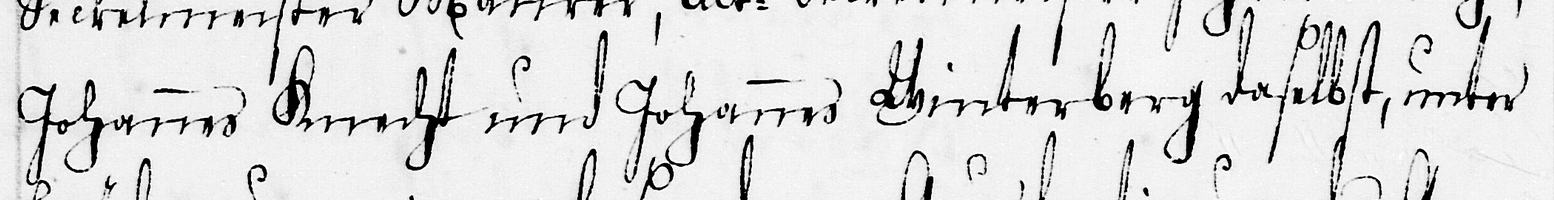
Johannes Knecht und Johannes Winterberg daselbst, unter
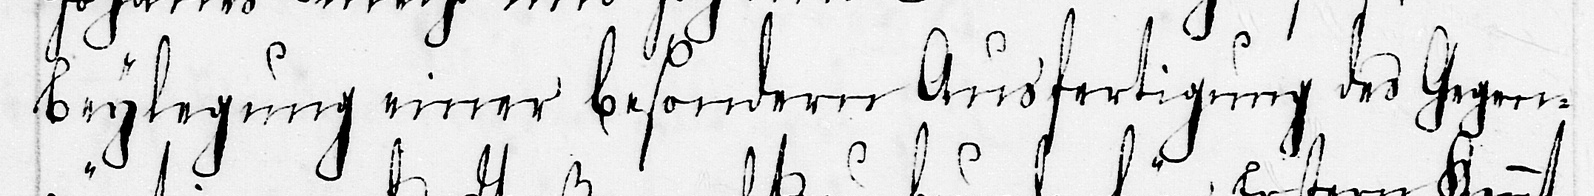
Beylegung einer besondern Ausfertigung des Gegen¬
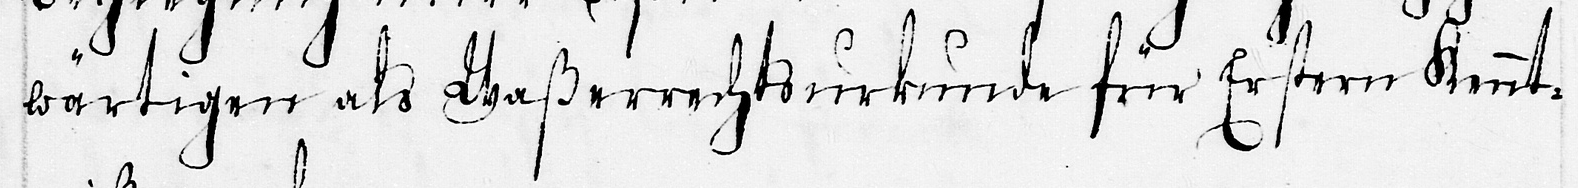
wärtigen als Waßerrechtsurkunde für Erstern Kennt¬
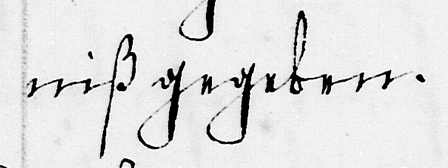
niß gegeben.
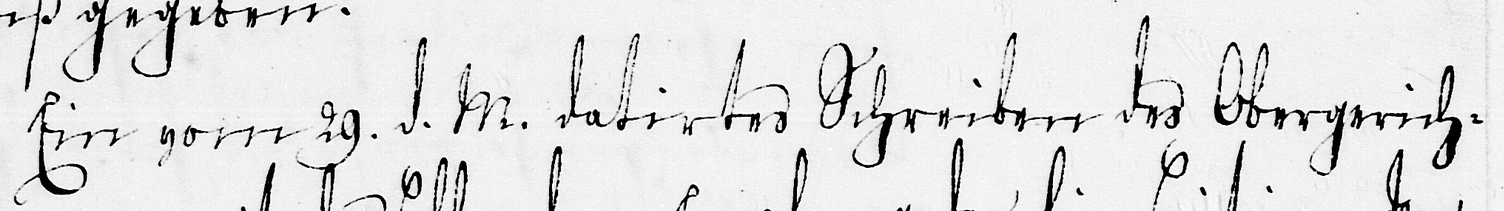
Ein vom 29. d. M. datirtes Schreiben des Obergerich¬
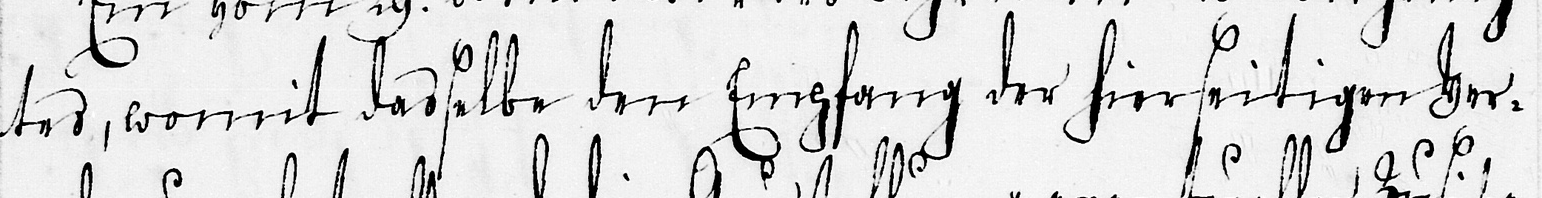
tes, womit dasselbe den Empfang der hierseitigen Ver¬
